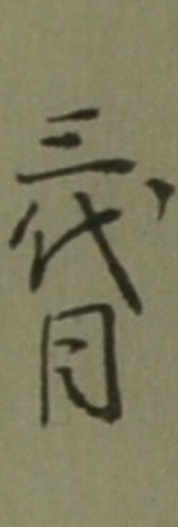三代目
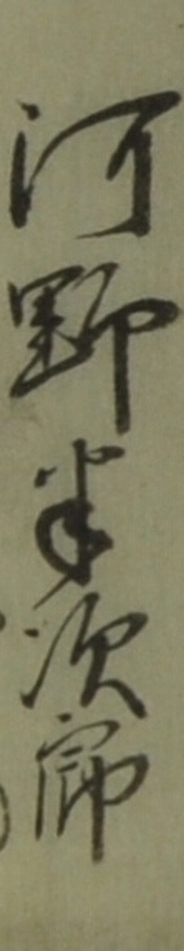河野半次郎

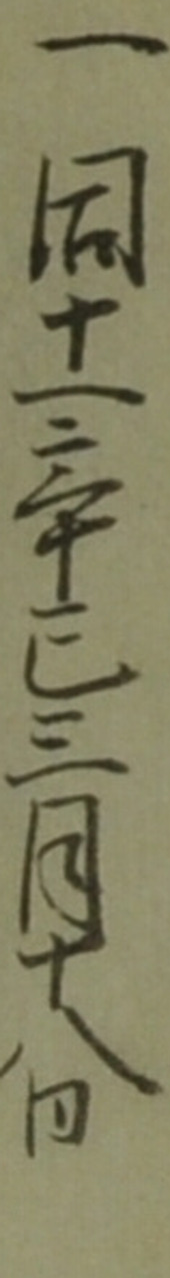一同十一辛巳三月十八日
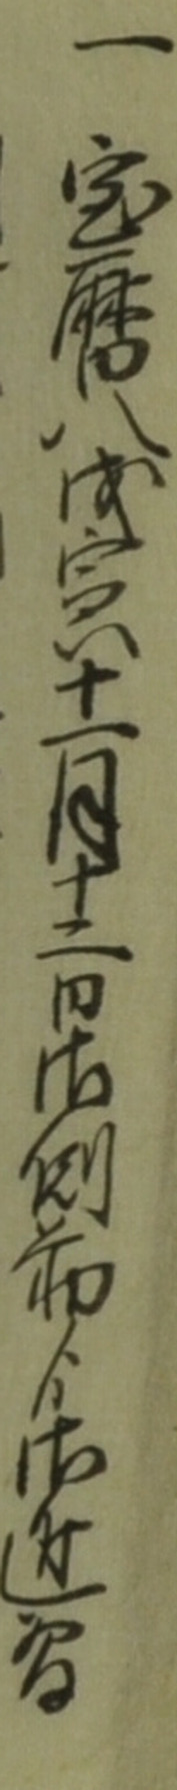一宝暦八戊寅十一月十二日御側勤ゟ御近習
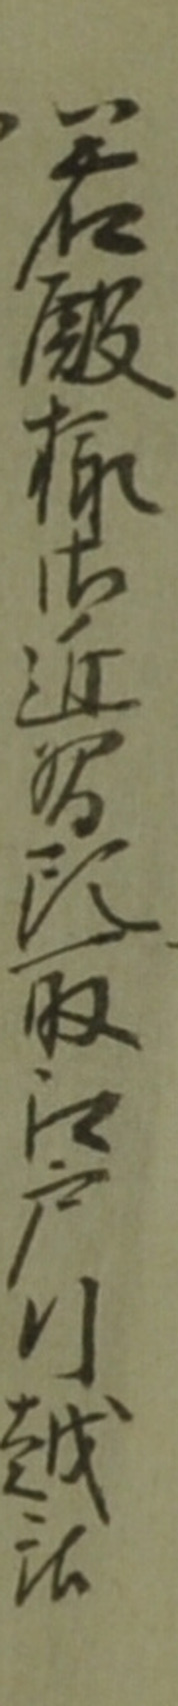若殿様御近習頭取江戸引越被
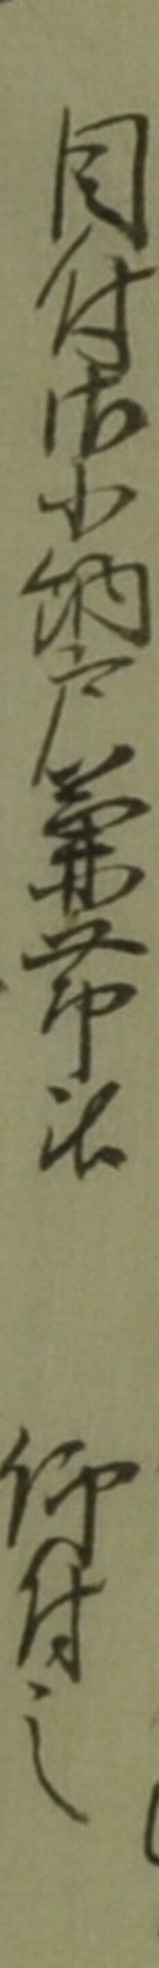目付御小納戸兼帯被仰出之
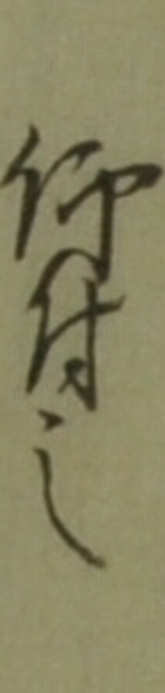仰付之
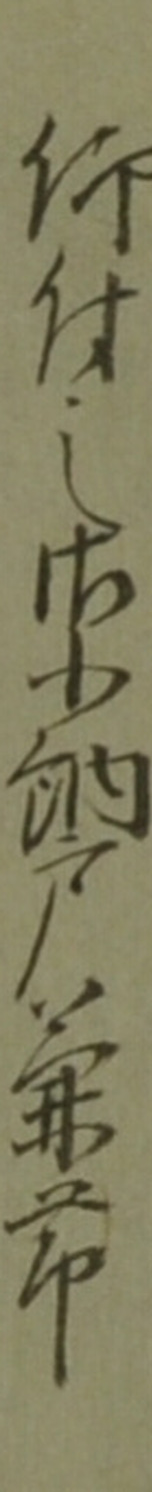仰付之御小納戸兼帯
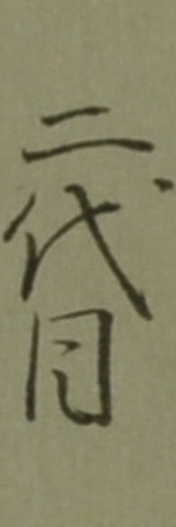二代目
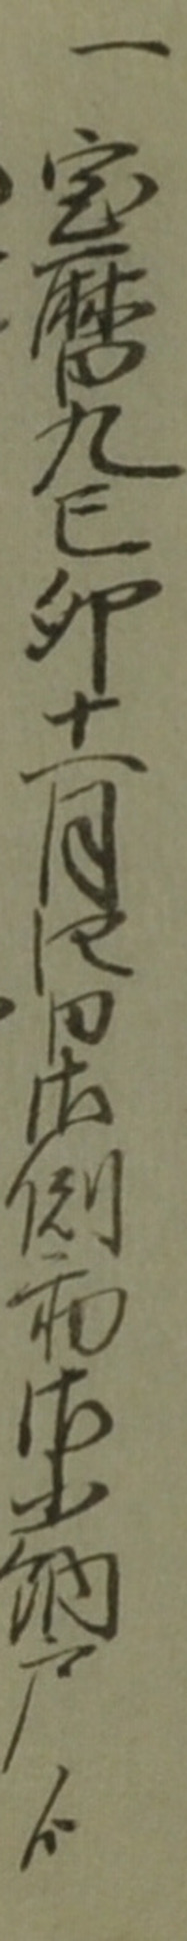一宝暦九己卯十一月四日御側勤御小納戸ゟ
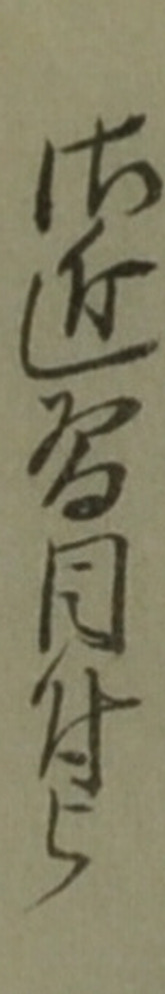帯御近習目付
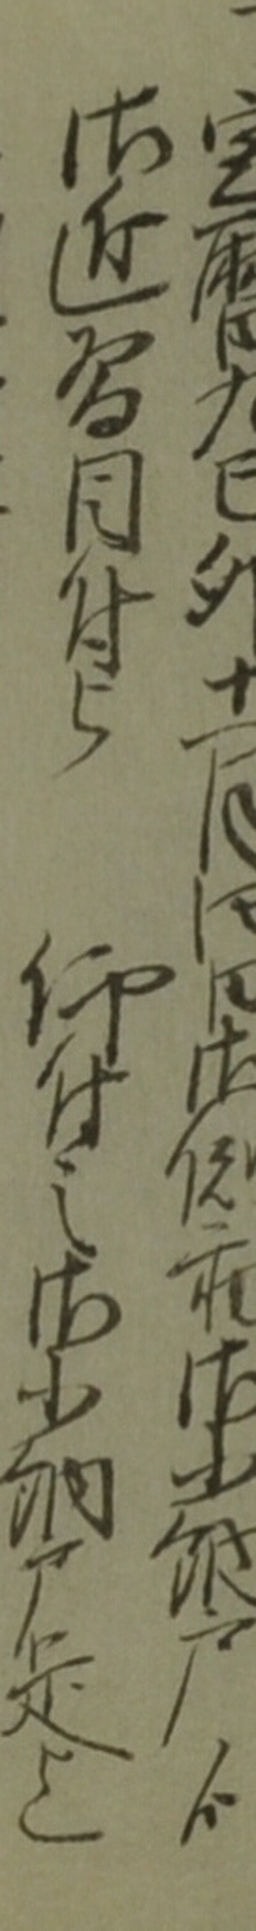御近習目付被仰付之御小納戸是迄
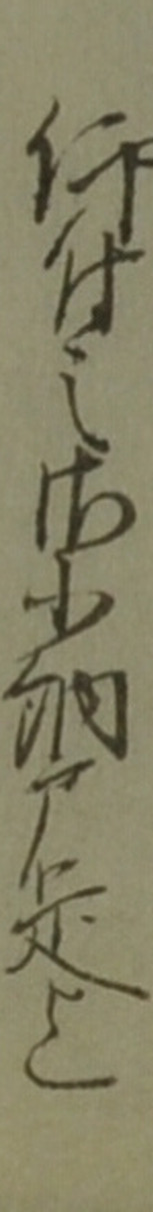仰付之御小納戸兼帯
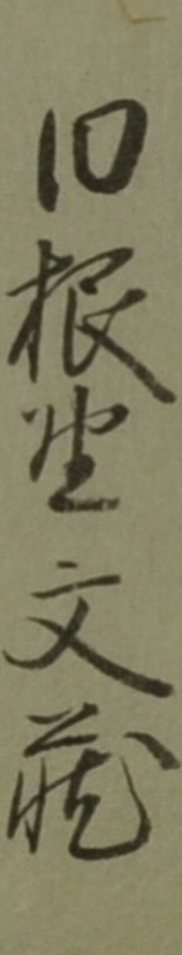日根野文蔵
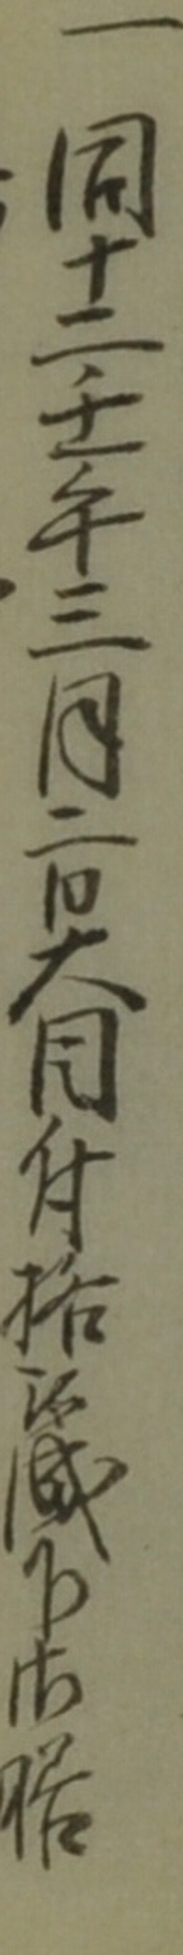一同十二壬午三月二日大目付格被成下御膳
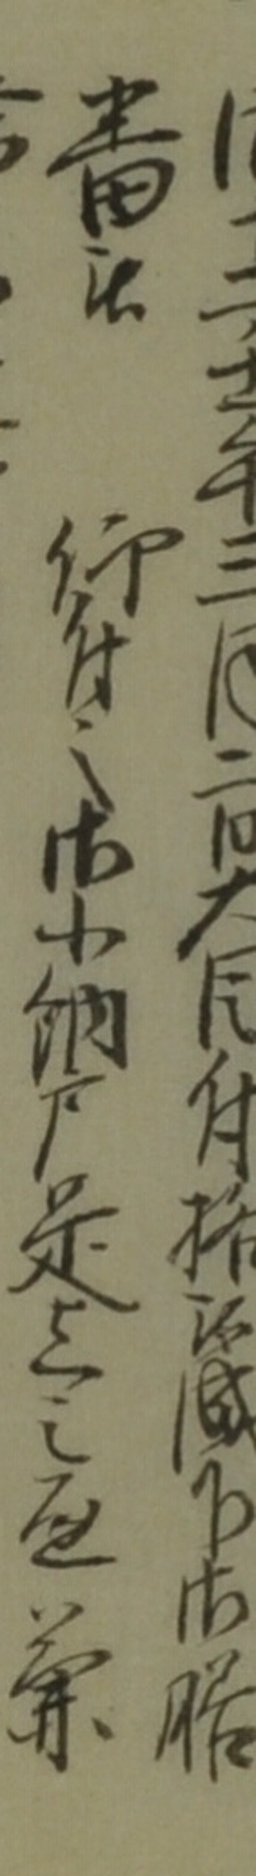番被仰付之御小納戸是迄之通兼
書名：諸御役代々録（四）
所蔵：伊那市立高遠町図書館・合同会社AMANE
